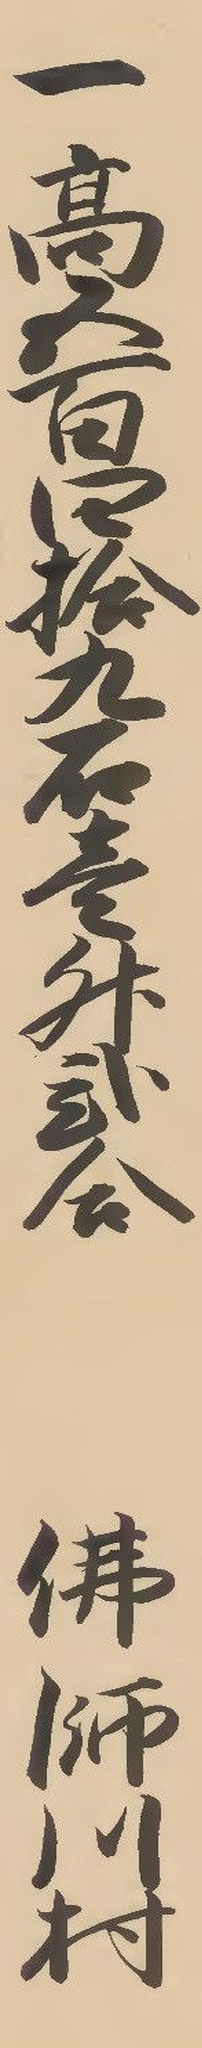一高五百四拾九石壱升弐合仏師川村
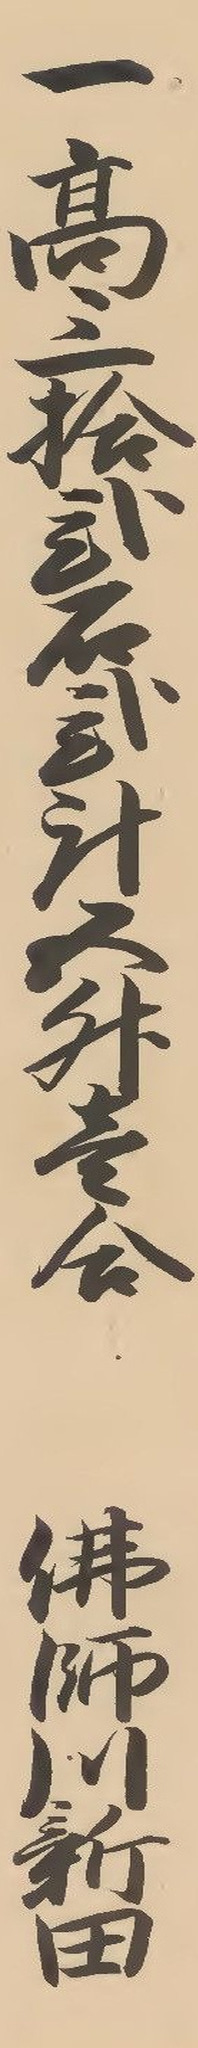一高三拾弐石弐斗五升壱合仏師川新田
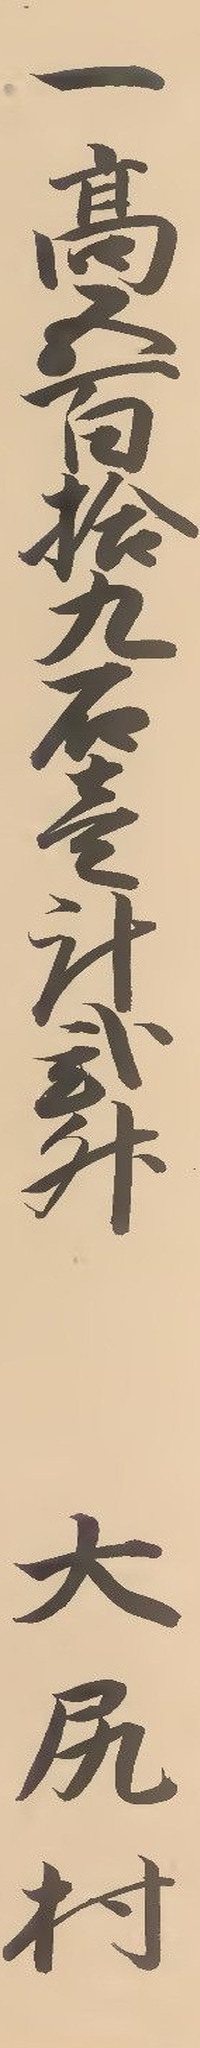一高五百拾九石壱斗弐升大尻村
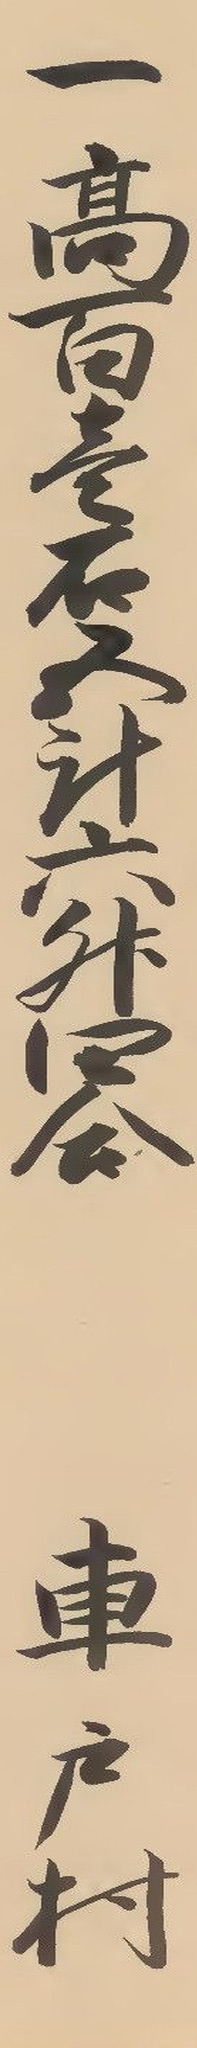一高百壱石五斗六升四合車戸村
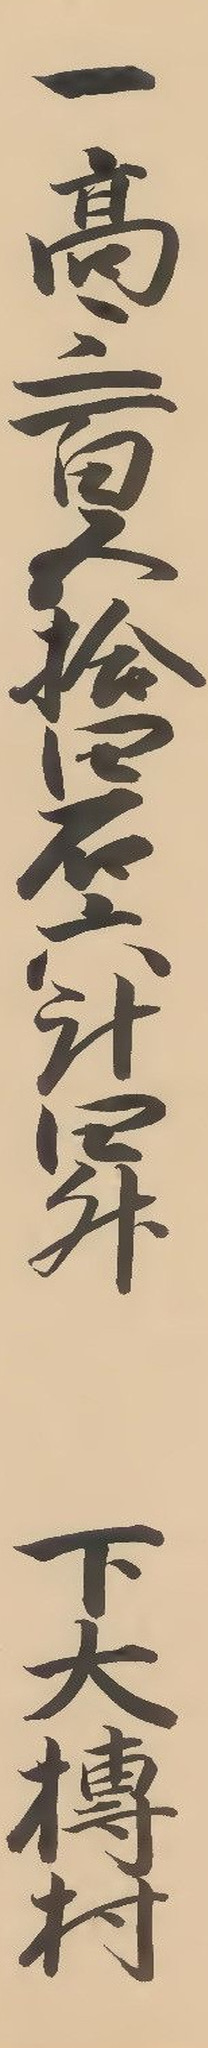一高三百五拾四石六斗四升下大榑村
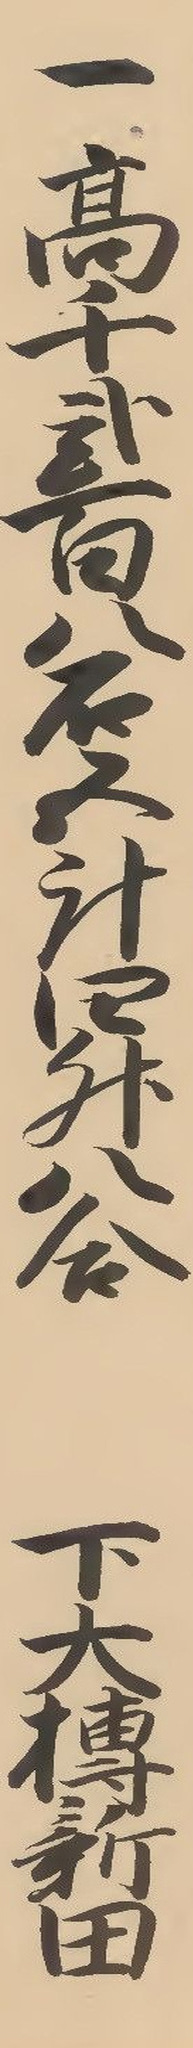一高千弐百八石五斗四升八合下大榑新田

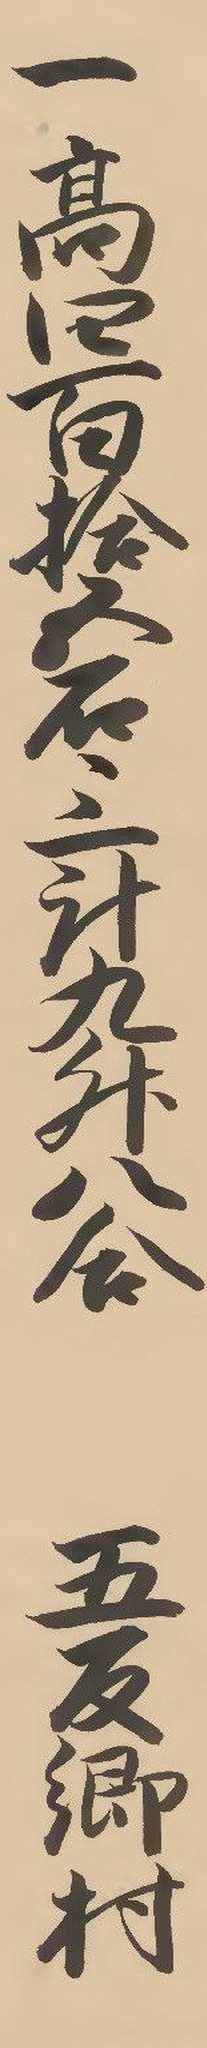一高四百拾五石三斗九升八合五反郷村
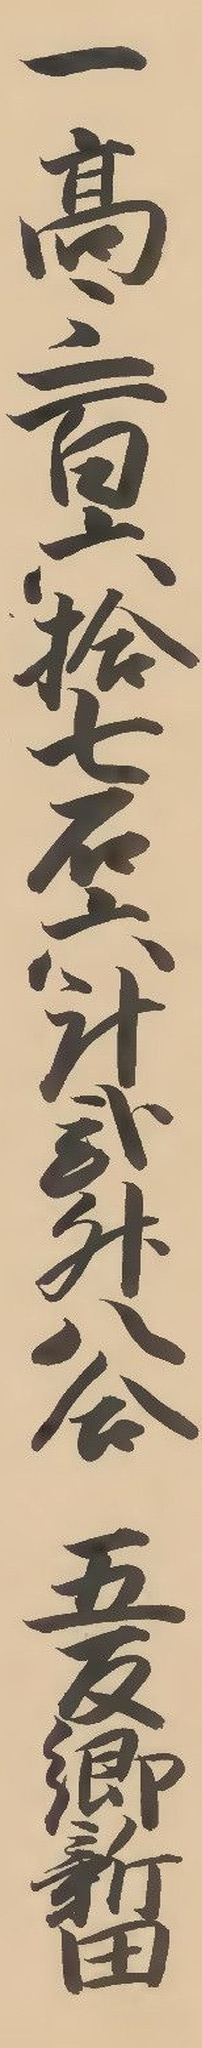一高三百六拾七石六斗弐升八合五反郷新田
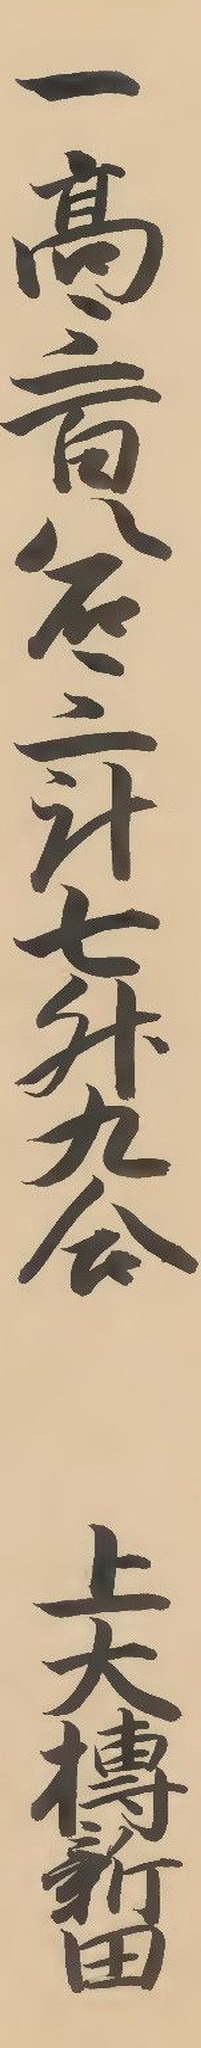一高三百八石三斗七升九合上大榑新田
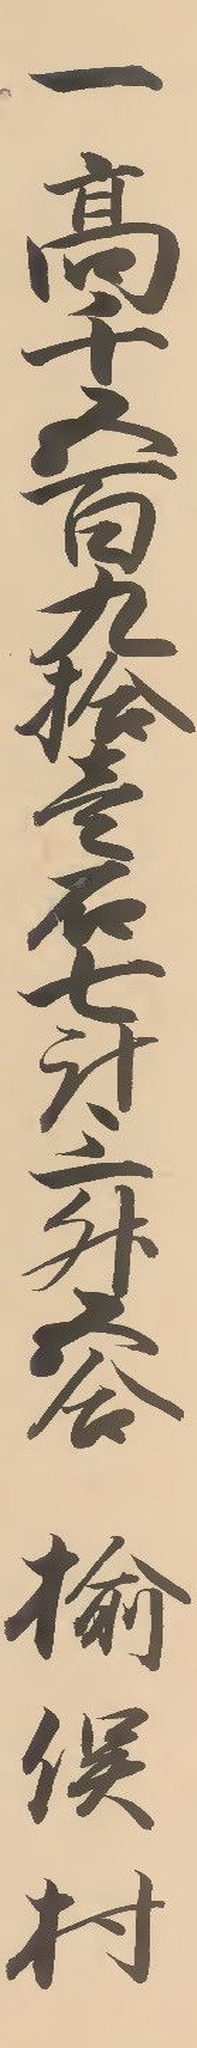一高千五百九拾壱石七斗三升五合楡俣村
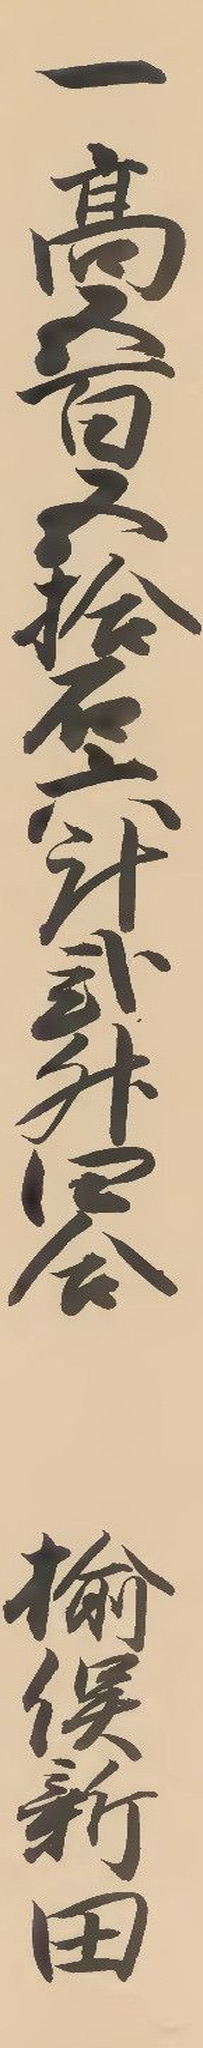一高五百五拾石六斗弐升四合楡俣新田
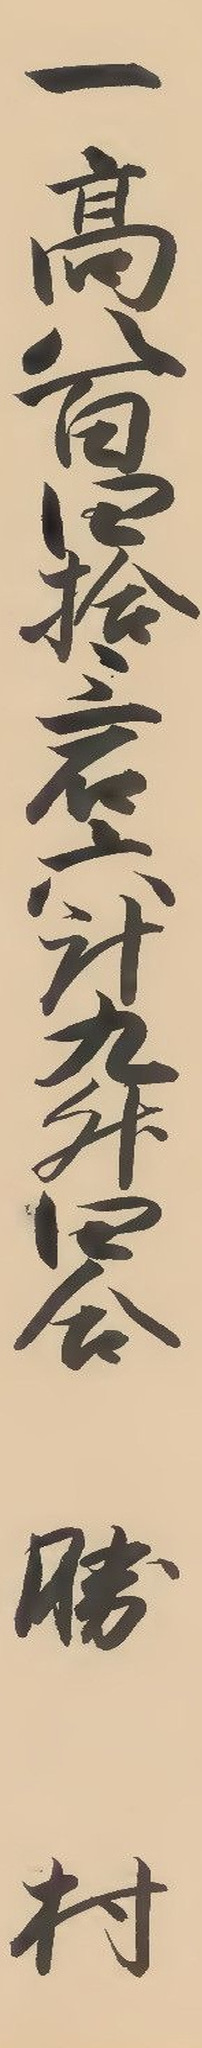一高八百四拾三石六斗九升四合勝村
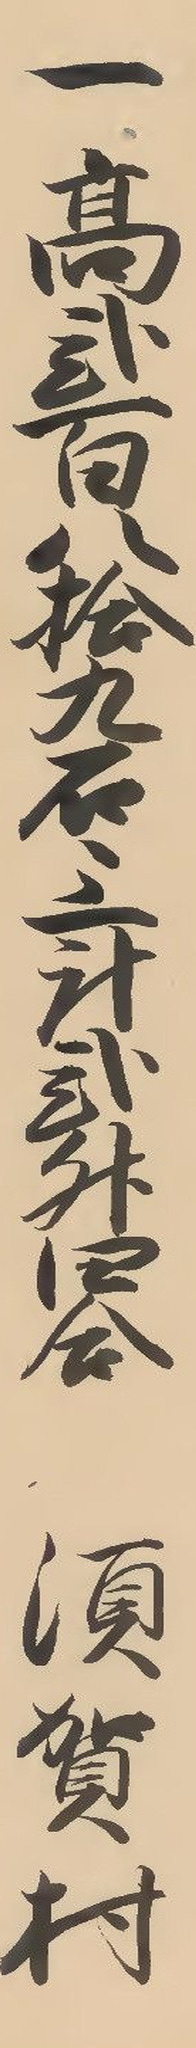一高弐百八拾九石三斗弐升四合須賀村

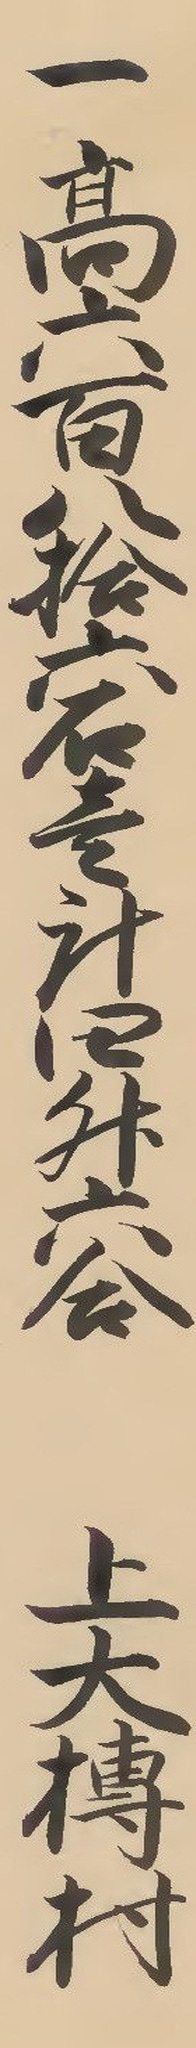一高六百八拾六石壱斗四升六合上大榑村
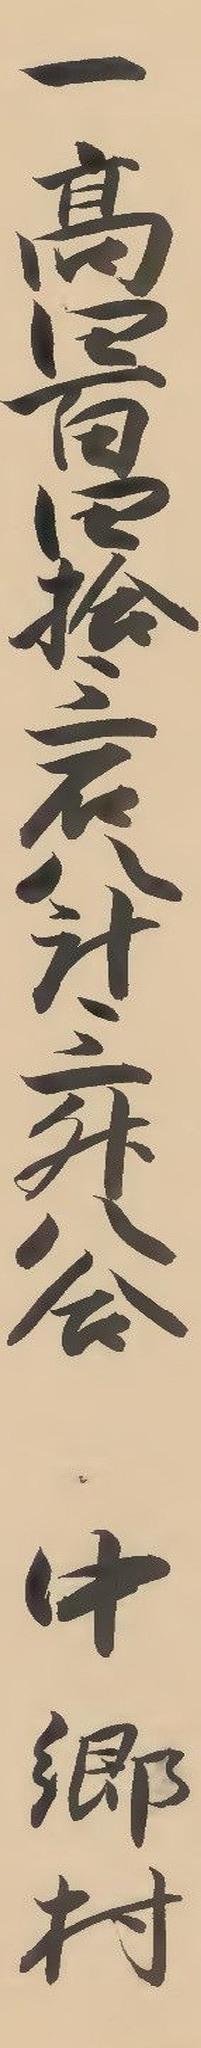一高四百四拾三石八斗三升八合中郷村
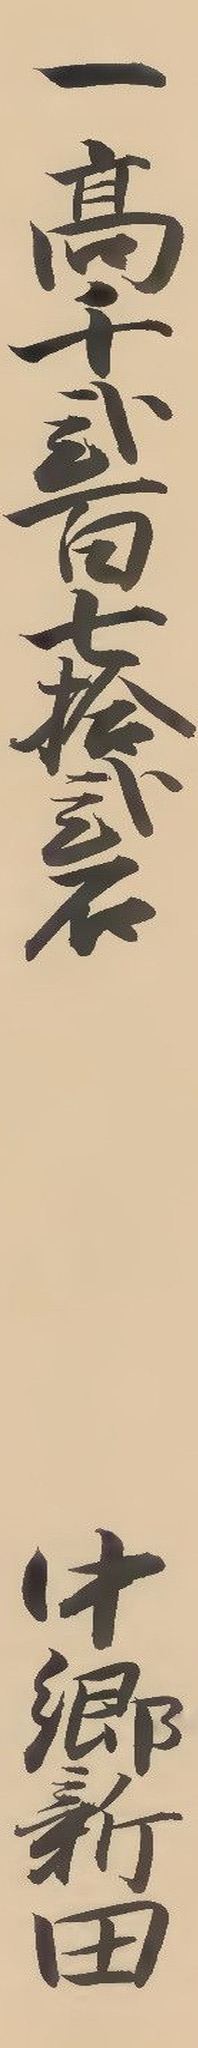一高千弐百七拾弐石中郷新田
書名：美濃国郷帳
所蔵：国立公文書館 National Archives of Japan
